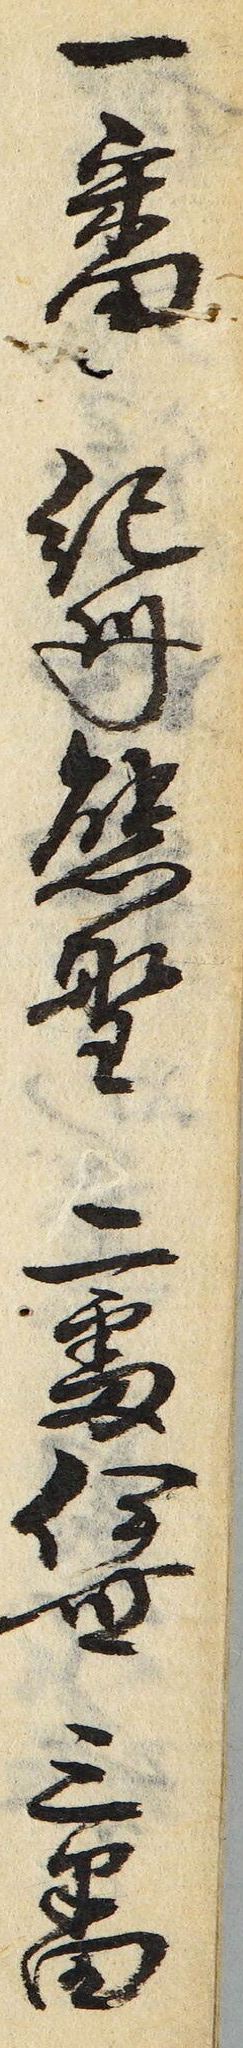一番紀州熊野二番伊せ三番
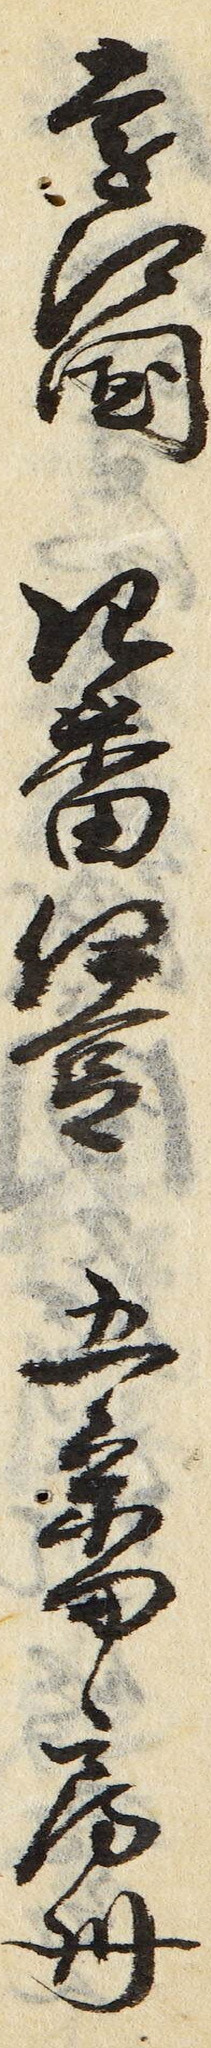遠江国四番伊豆五番房州
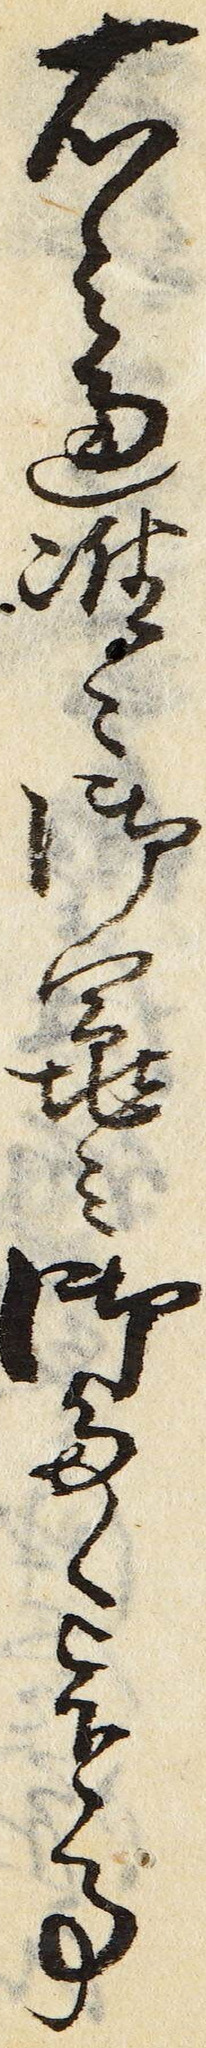右之通唯々御鬮之御たく被下候事
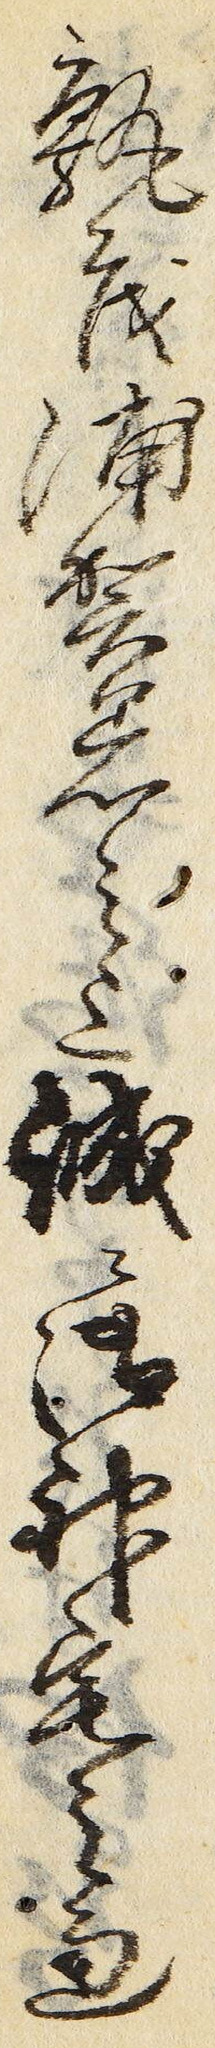孰も浦賀着之上誠ニ御神宅之通
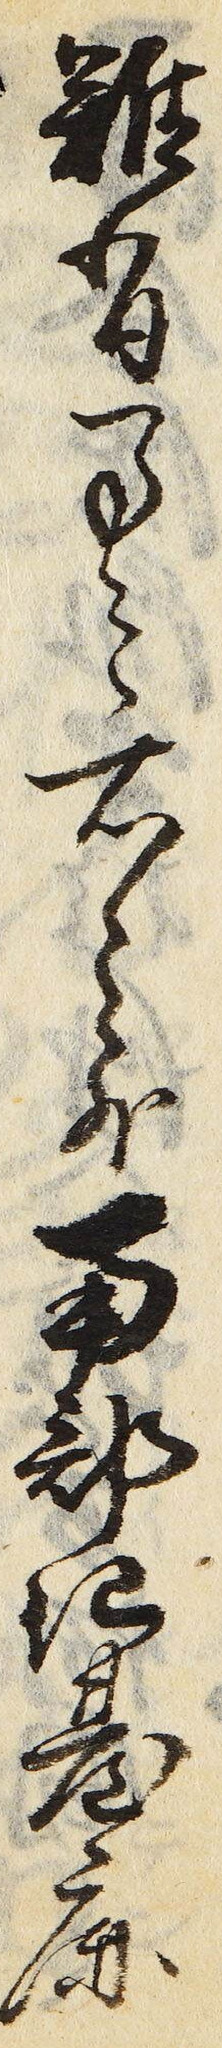難有事ニ候右之外南部仙台鹿
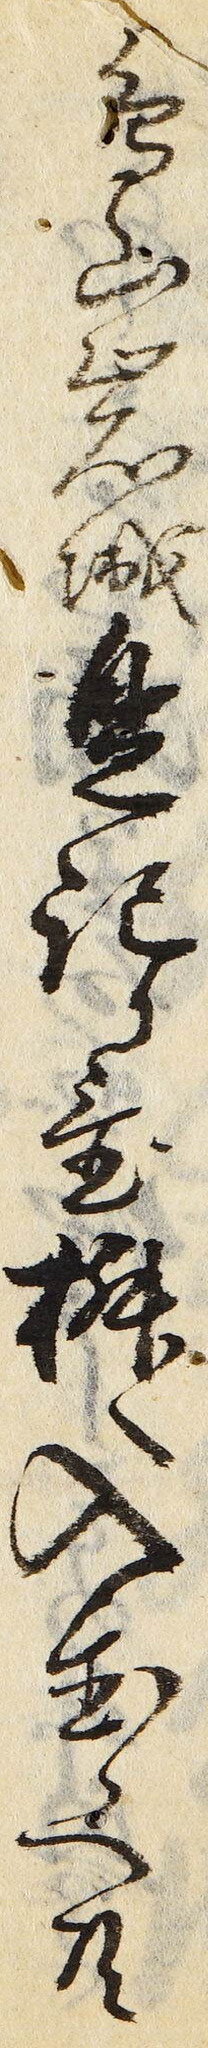島山岩城記り置枡へ入置候へ共
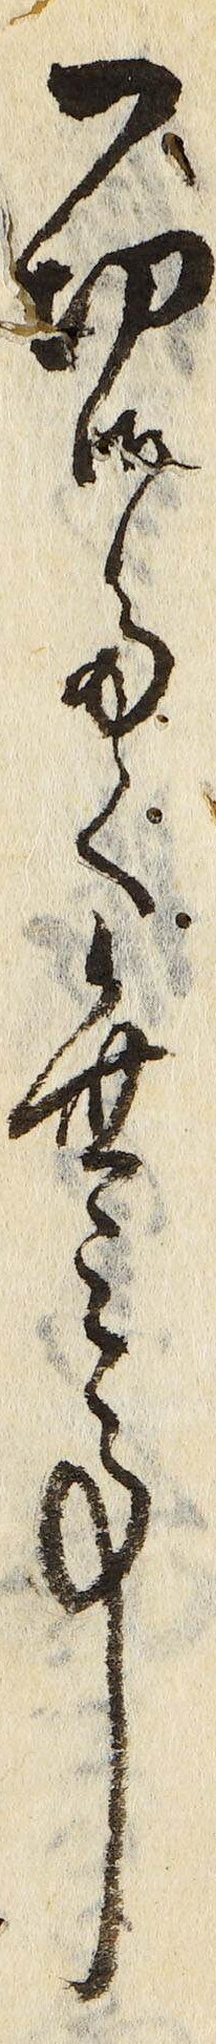一切御たく無之事

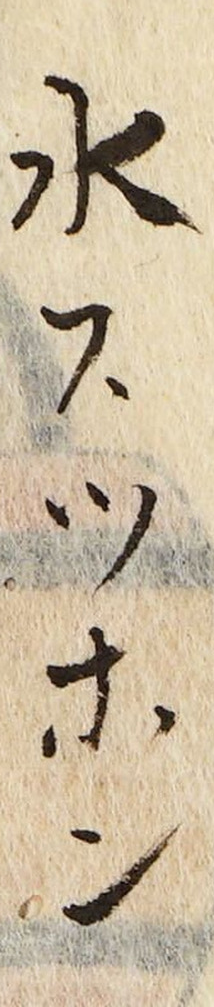水スツホン

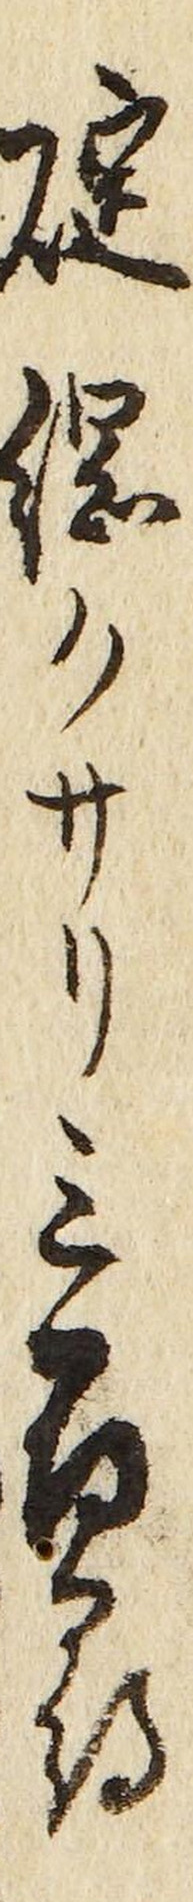碇綱クサリ三百尋
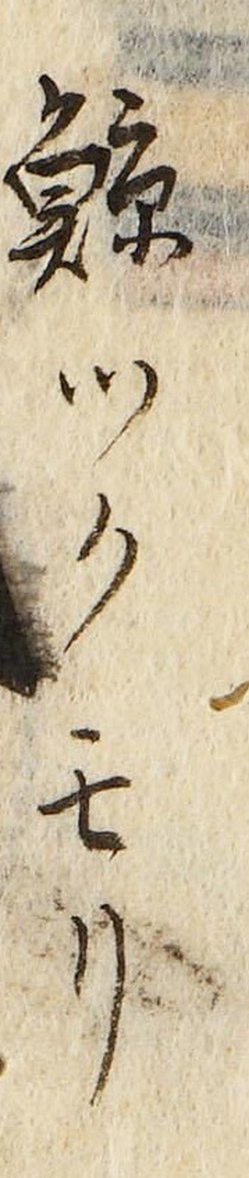鯨ツクモリ

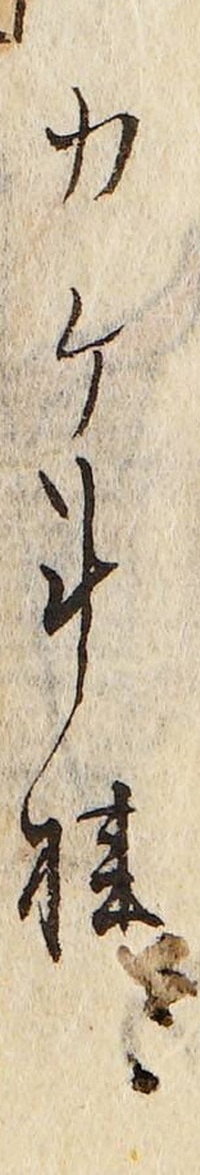カケ斗桂

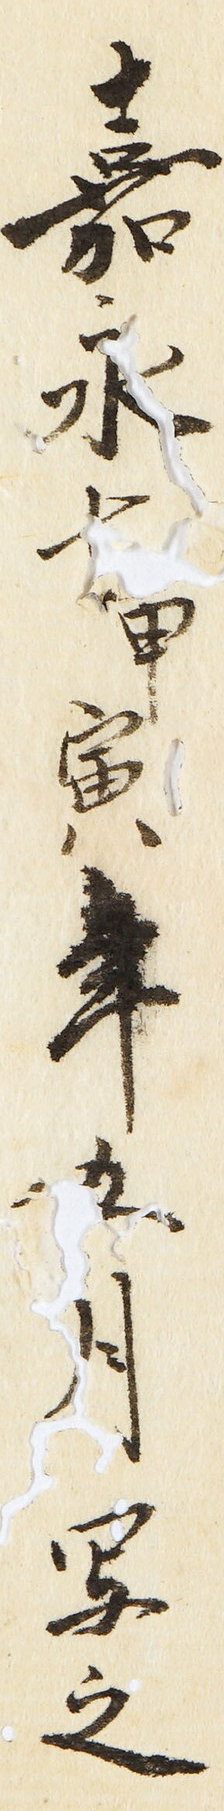嘉永七甲寅年九月写之

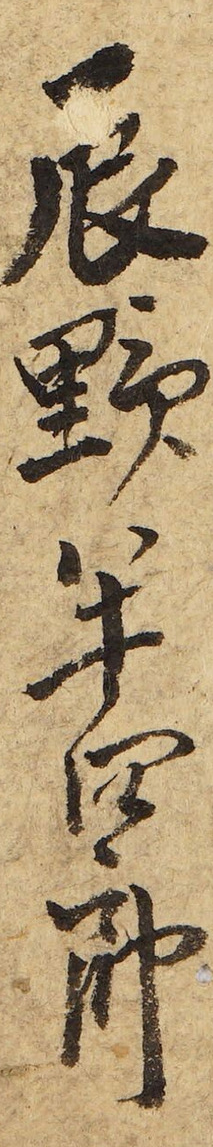辰野半四郎
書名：阿波幸宝丸漂流記
